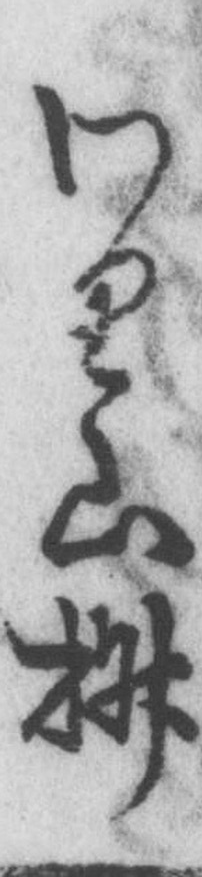わ里山椒
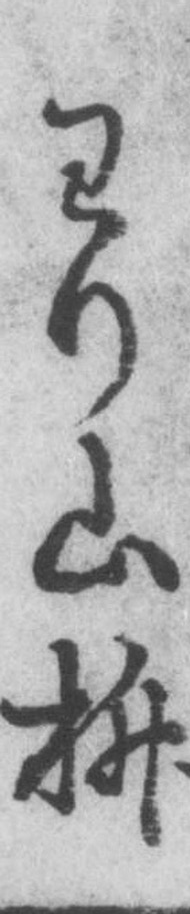わ里山椒

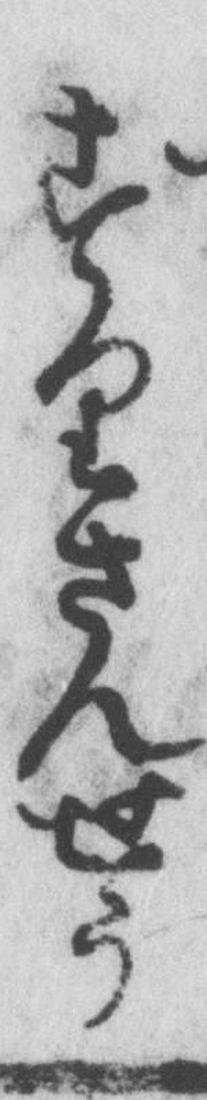わりさんせう
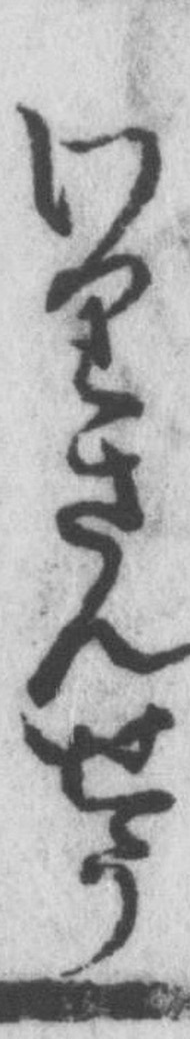わりさんせう
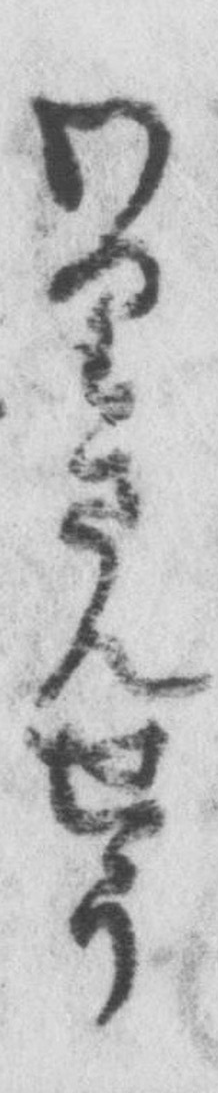わりさんせう
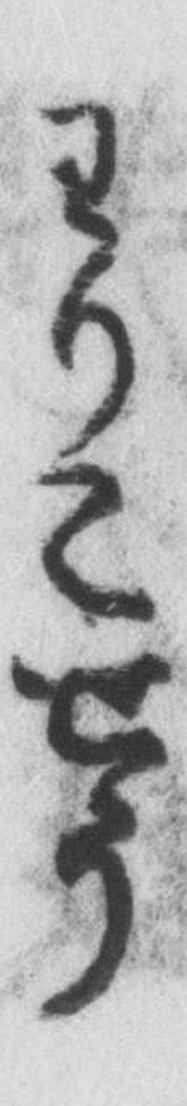わりこせう
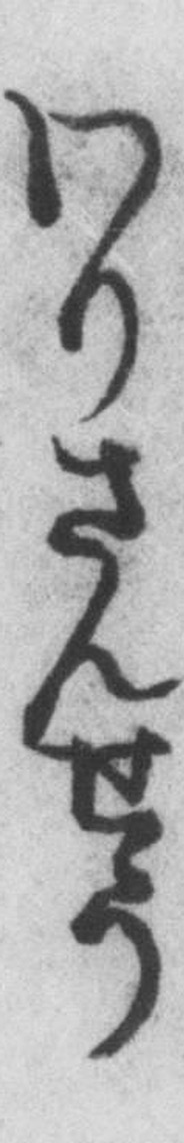わりさんせう

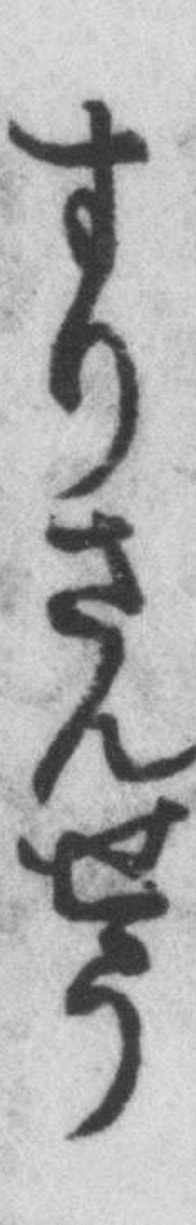すりさんせう
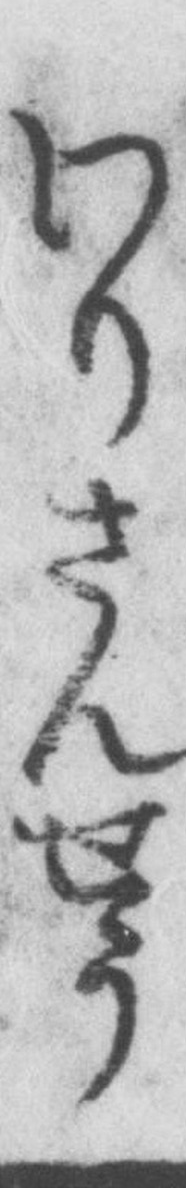すりさんせう
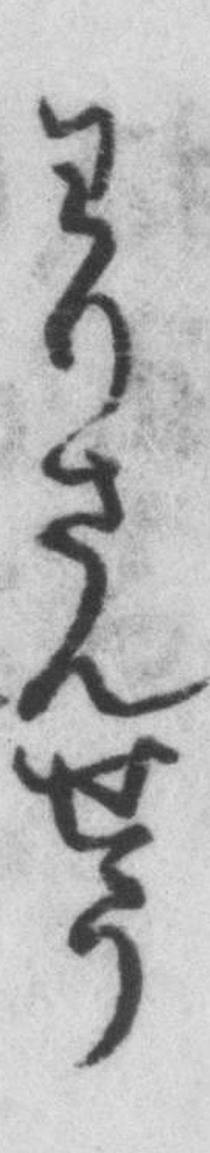すりさんせう
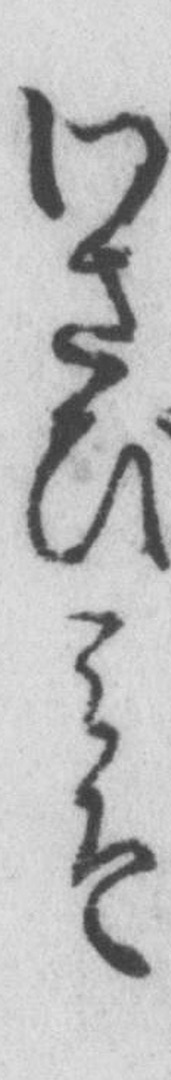わさびみそ
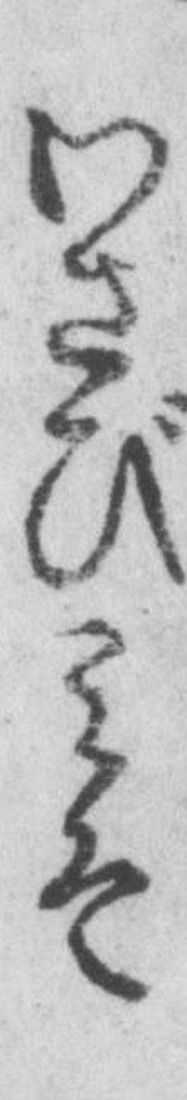わさびみそ

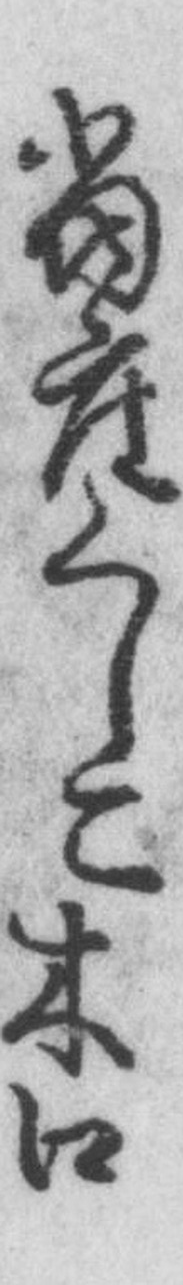当座くしこ木口
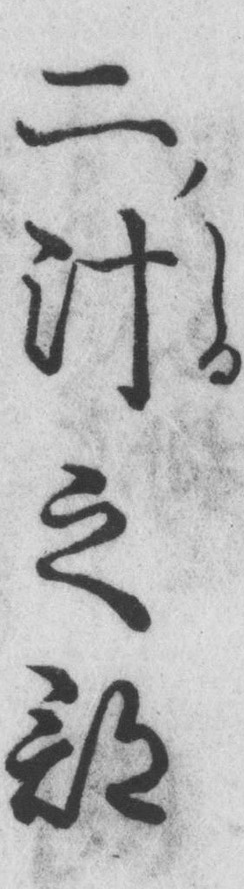二汁之部

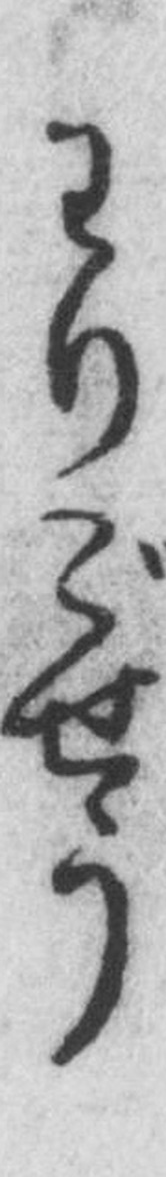わりごせう

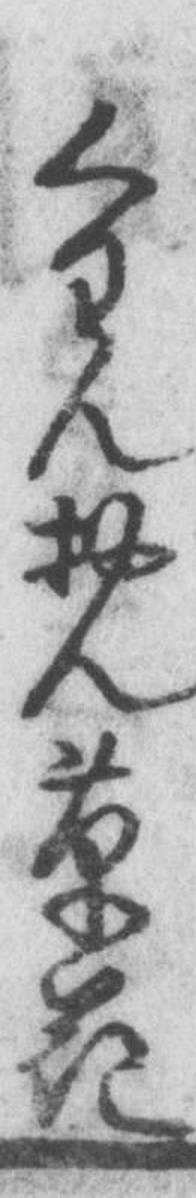ゆくわんおん草花
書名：料理伊呂波庖丁
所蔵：大阪府立大学学術情報センター 国文学研究資料館
